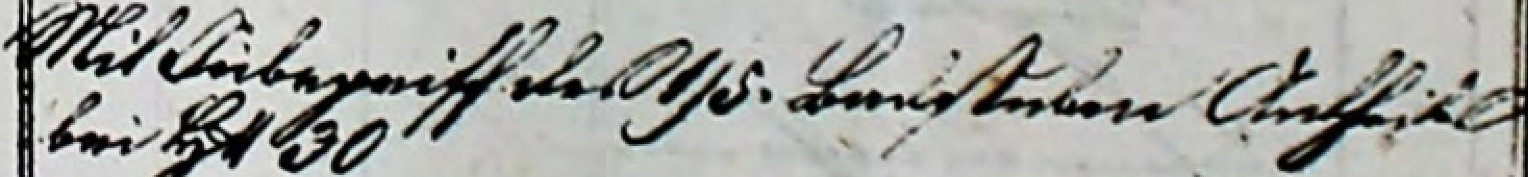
Mit Inbegriff des 95, Badstuben Antheiles
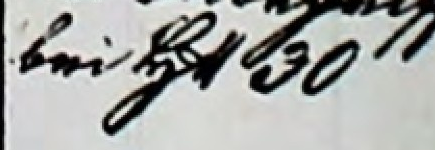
bei H? 30
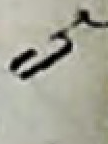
5
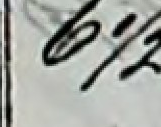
6 ½
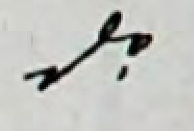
do
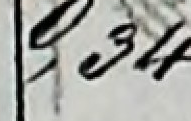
0,34
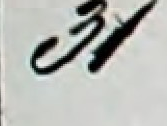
31
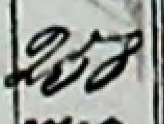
258
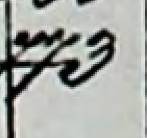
773
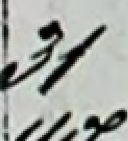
31
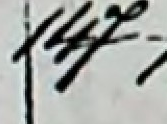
147
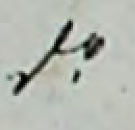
do
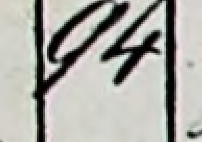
94
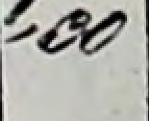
1,00
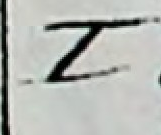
I
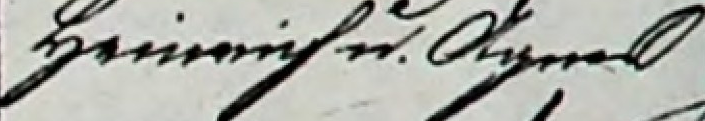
Heinrich u. Agnes
